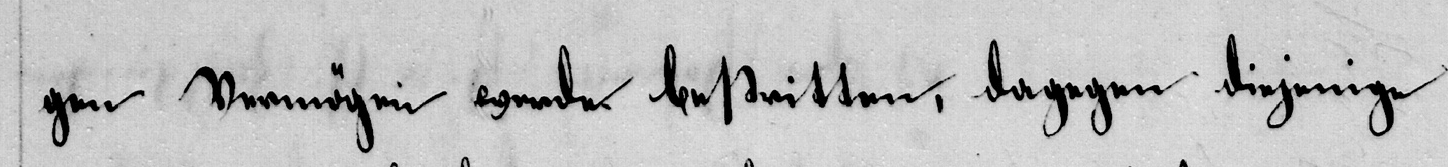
gen Vermögen werde bestritten, dagegen diejenige
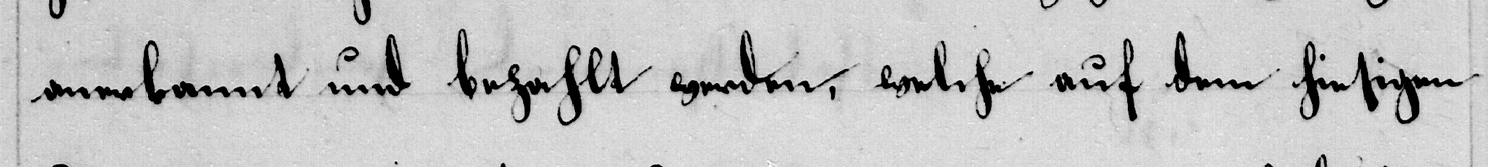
anerkannt und bezahlt werden, welche auf dem hiesigen
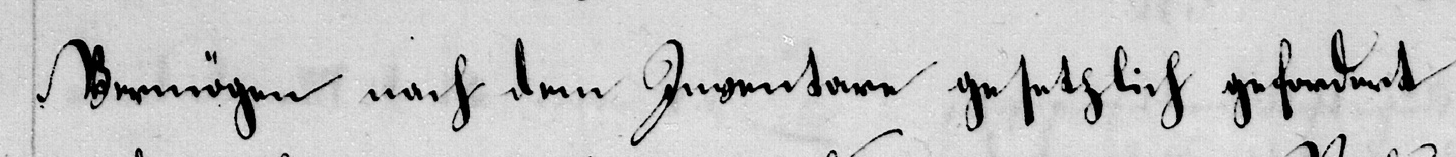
Vermögen nach dem Inventare gesetzlich gefordert
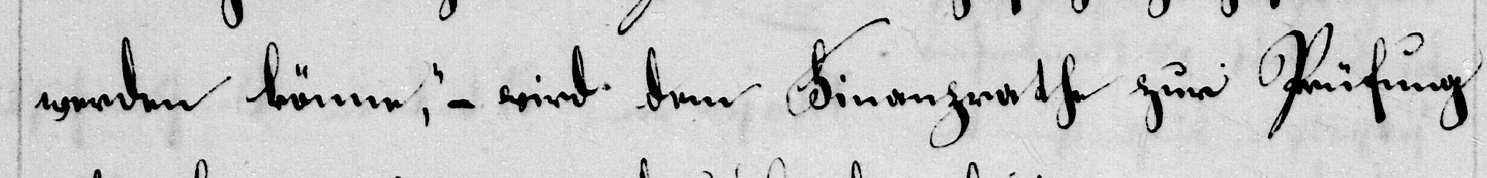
werden könne,“ – wird dem Finanzrathe zur Prüfung
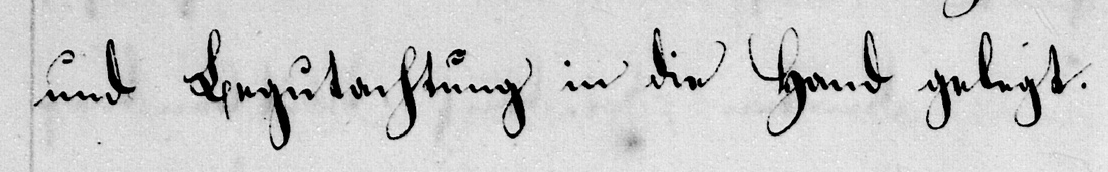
und Begutachtung in die Hand gelegt.
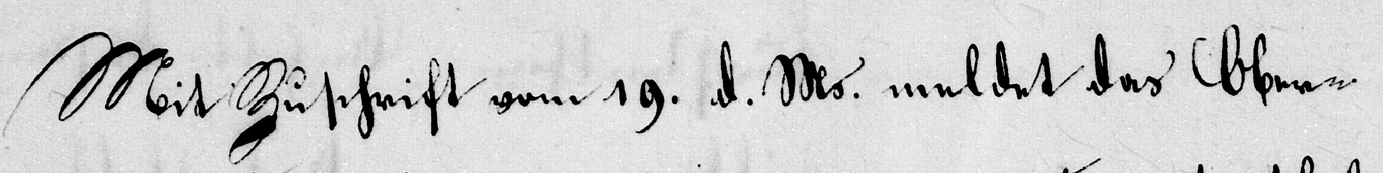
Mit Zuschrift vom 19. d. Ms. meldet das Ober¬
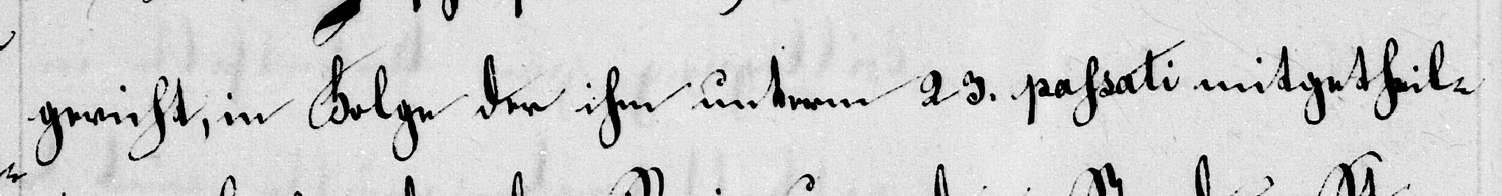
gericht, in Folge der ihm unterm 23. passati mitgetheil¬
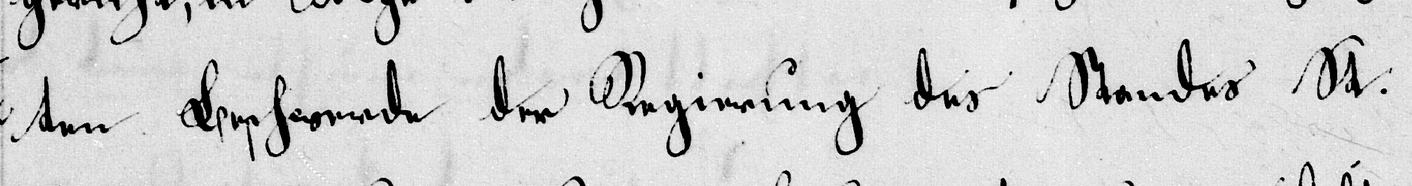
ten Beschwerde der Regierung des Standes St.
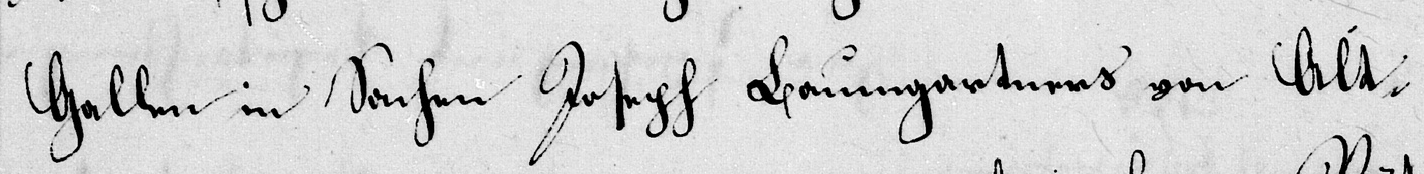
Gallen in Sachen Joseph Baumgartners von Alt¬
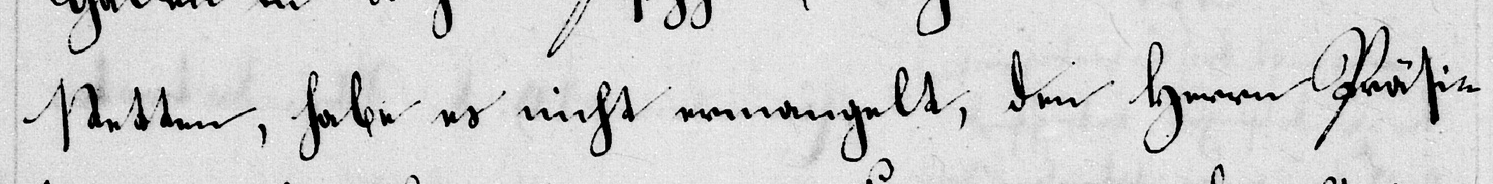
stetten, habe es nicht ermangelt, den Herrn Präsi¬
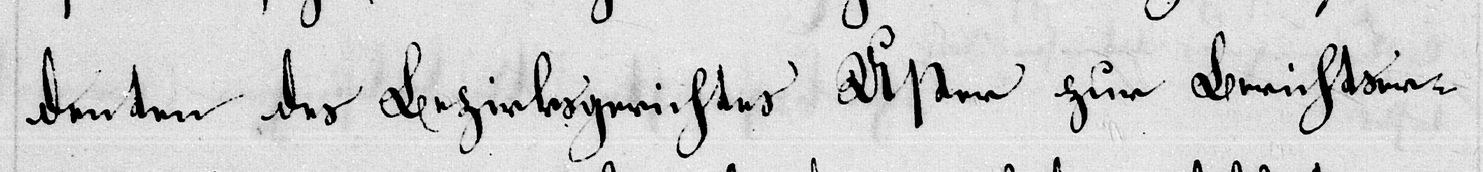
denten des Bezirksgerichtes Uster zur Berichtser¬
